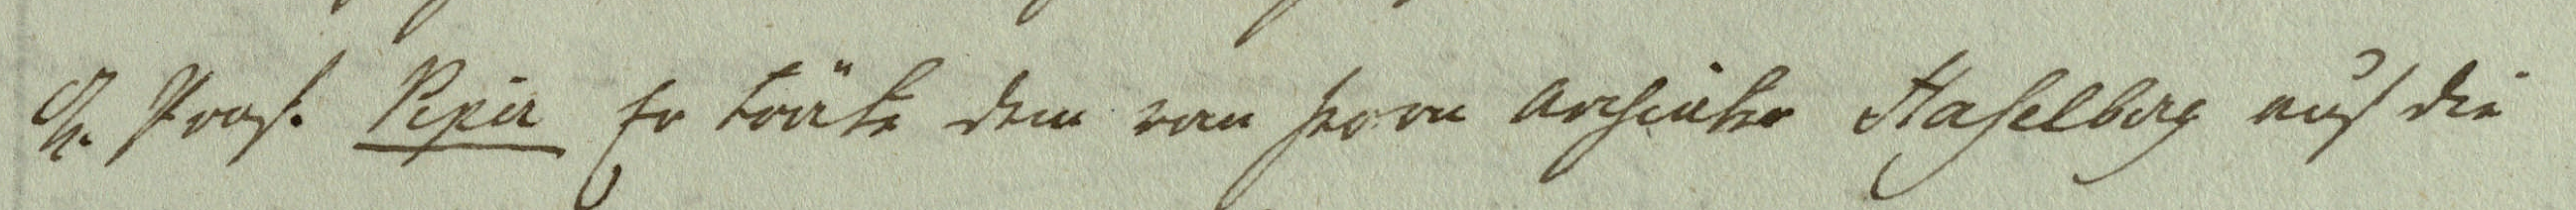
dh. Prof. Piper Er träte dem vom herrn Archiater Haselberg auf die
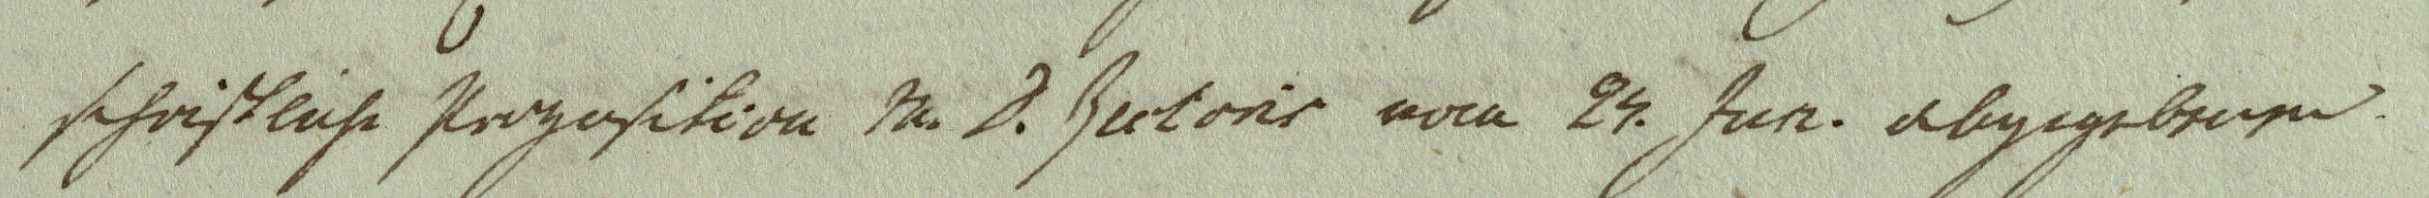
schriftliche Proposition M. D. Rectoris vom 24. Jun. abgegebene
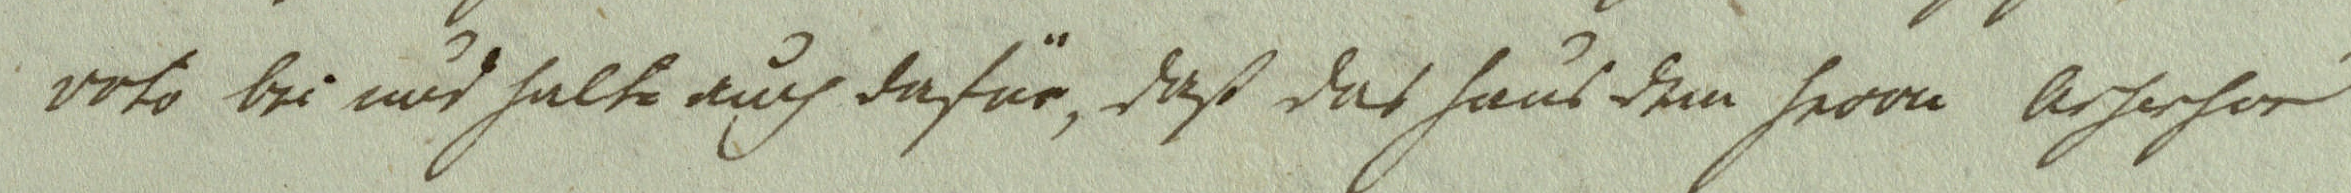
voto bei und halte auch dafür, daß das Haus dem herrn Assessor
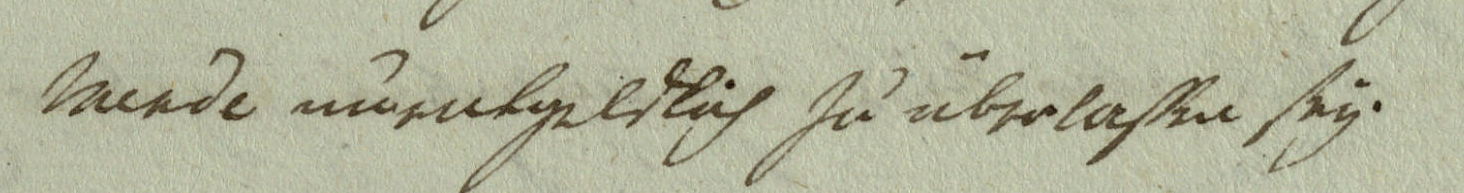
Mende unentgeldlich zu überlassen seÿ.
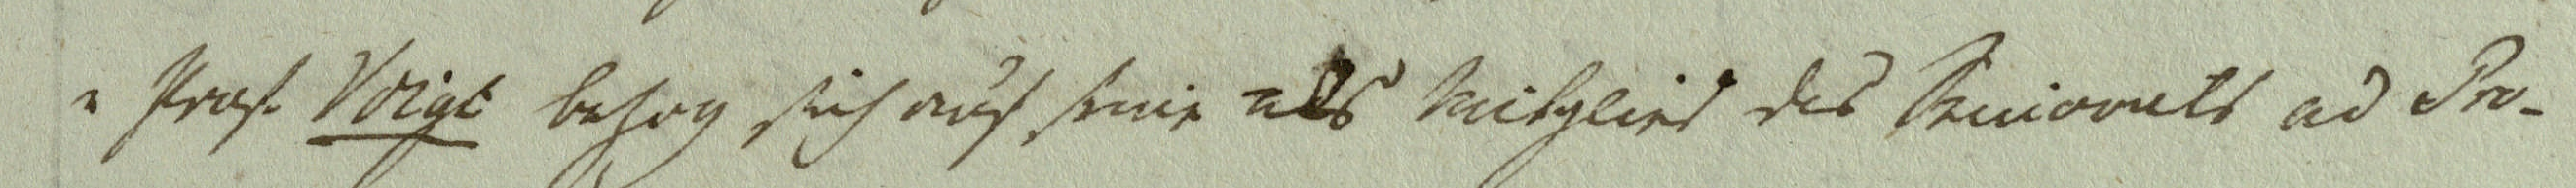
Prof. Voigt bezog sich auf seine als Mitglied des Seniorats ad Pro¬
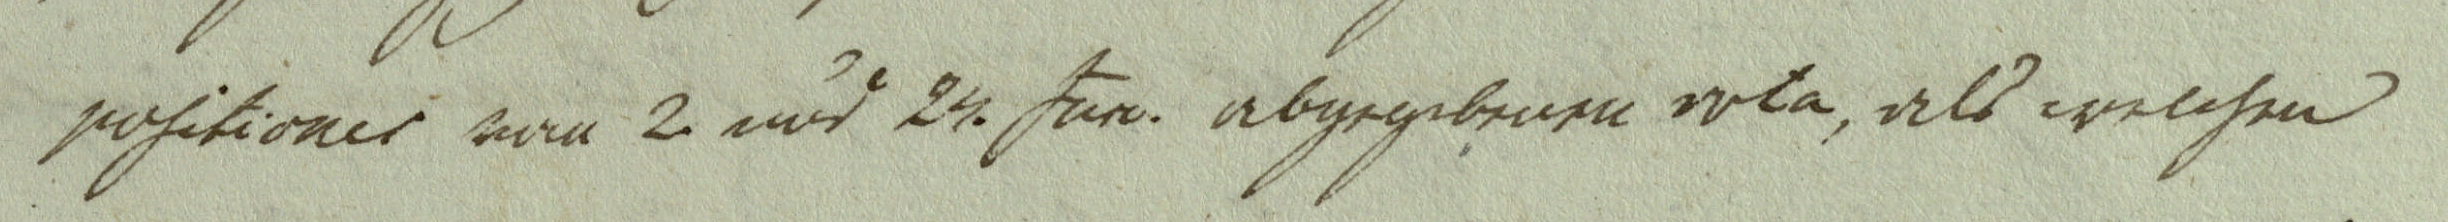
positiones vom 2. und 24. Jun. abgegebenen vota, als welchem
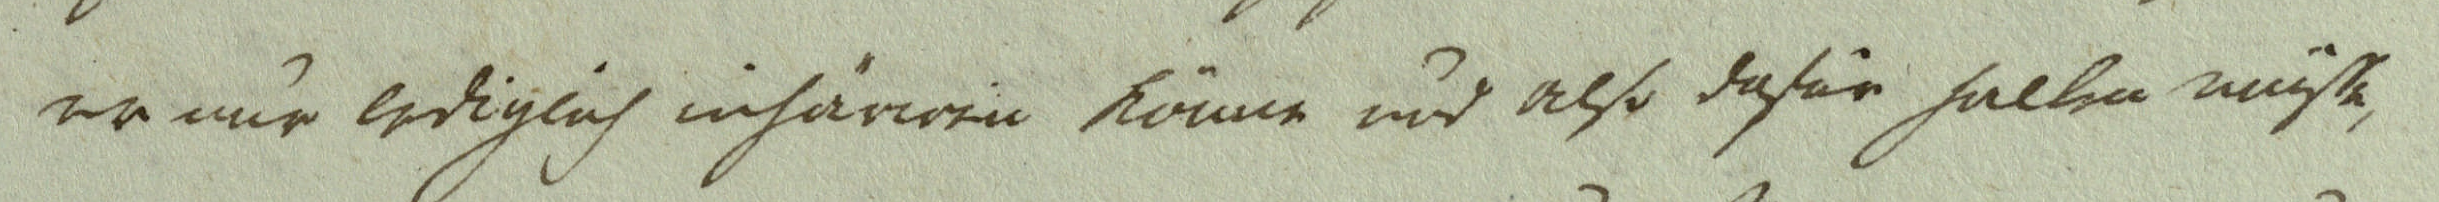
ernur lediglich inhäriren könne und also dafür halen müsse,
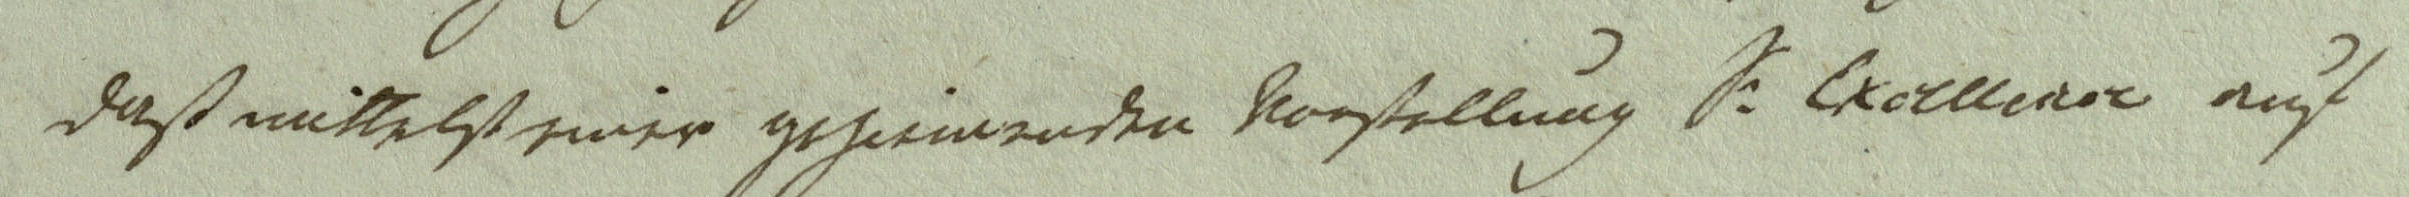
daß mittelst einer geziemenden Vorstellung Sr. Excellence auf
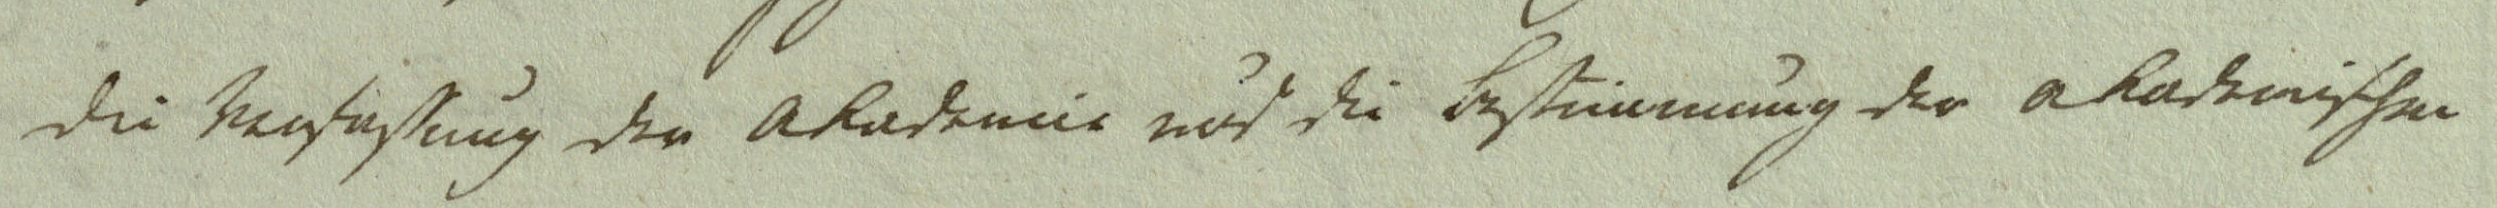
die Verfassung der Akademie und die Bestimmung der akademischen
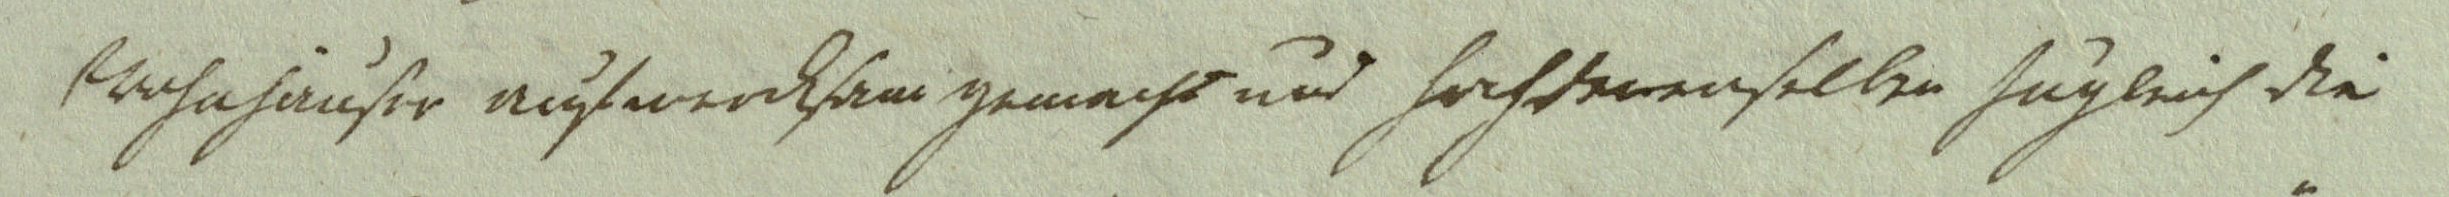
Wohnhäuser aufmercksam gemacht und hochdenenselben zugleich die
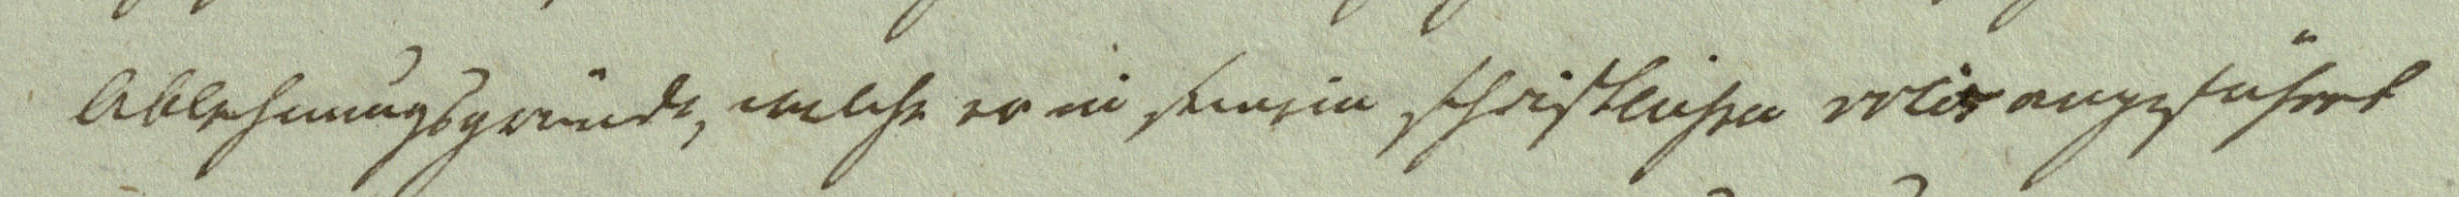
Ablehnungsgründe, welche in seinen schriftlichen votis angeführet
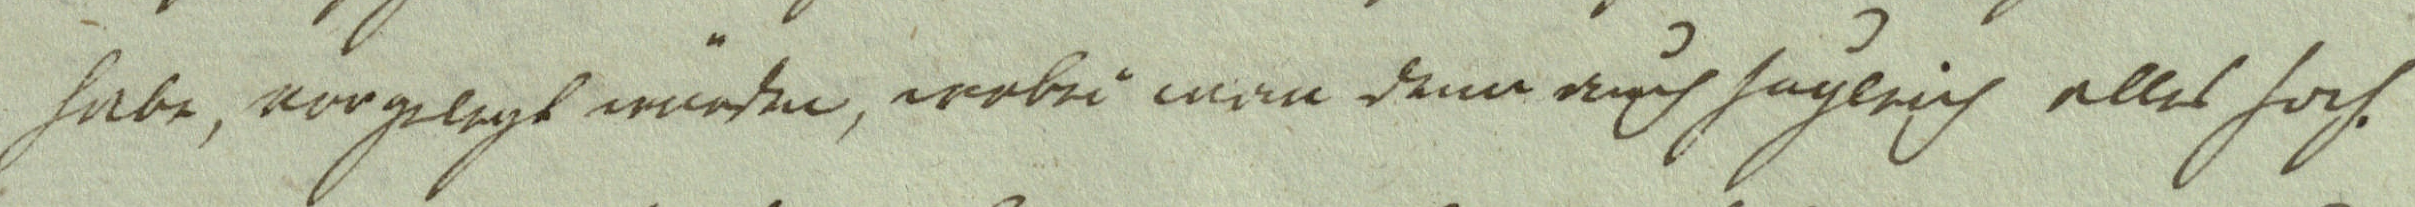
habe, vorgelegt würden, wobei man denn auch sogleich alles hoch¬
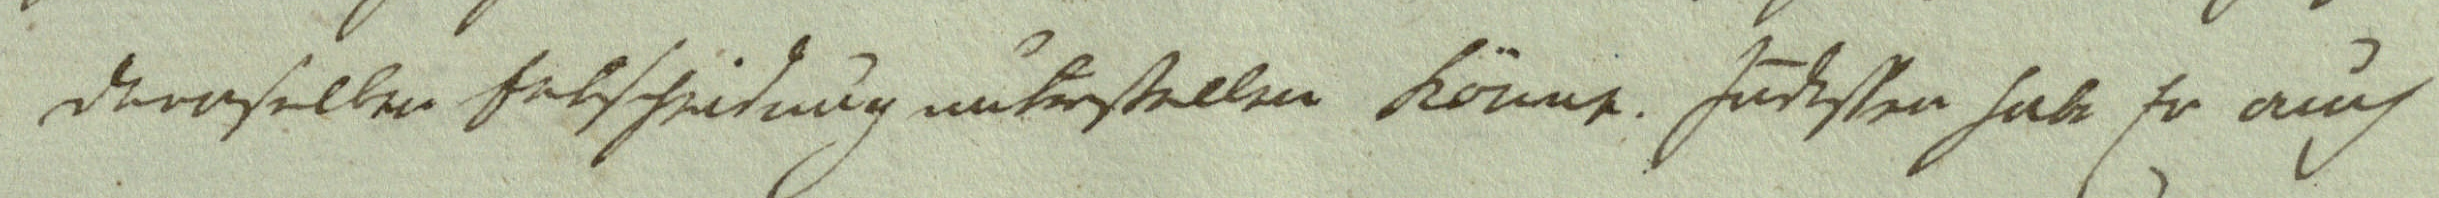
deroselben Entscheidung unterstellen könne. Indessen habe Er auch
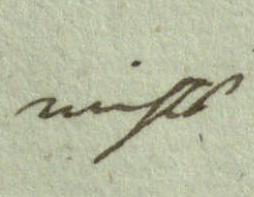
nichts
